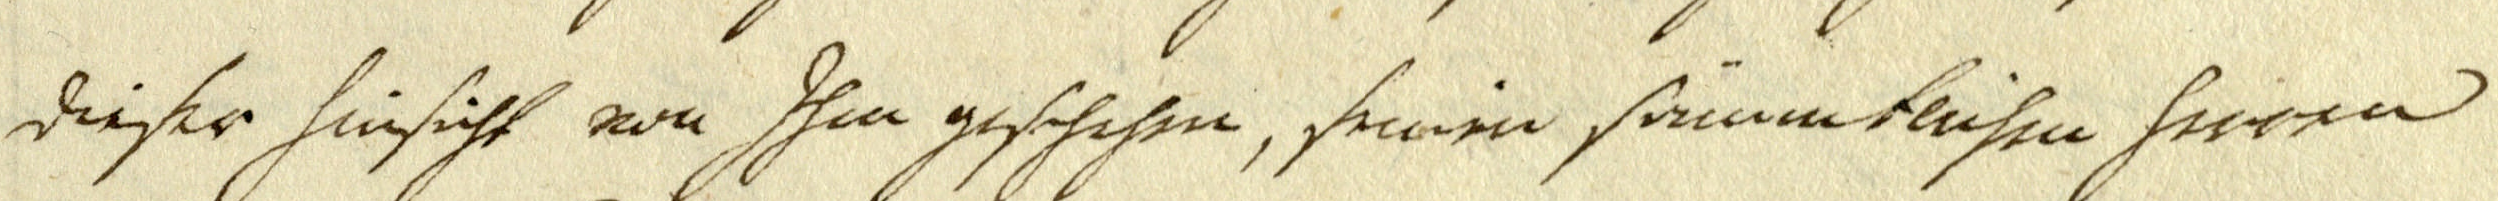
dieser hinsicht von Ihm geschehen, seinen sämmtlichen herren
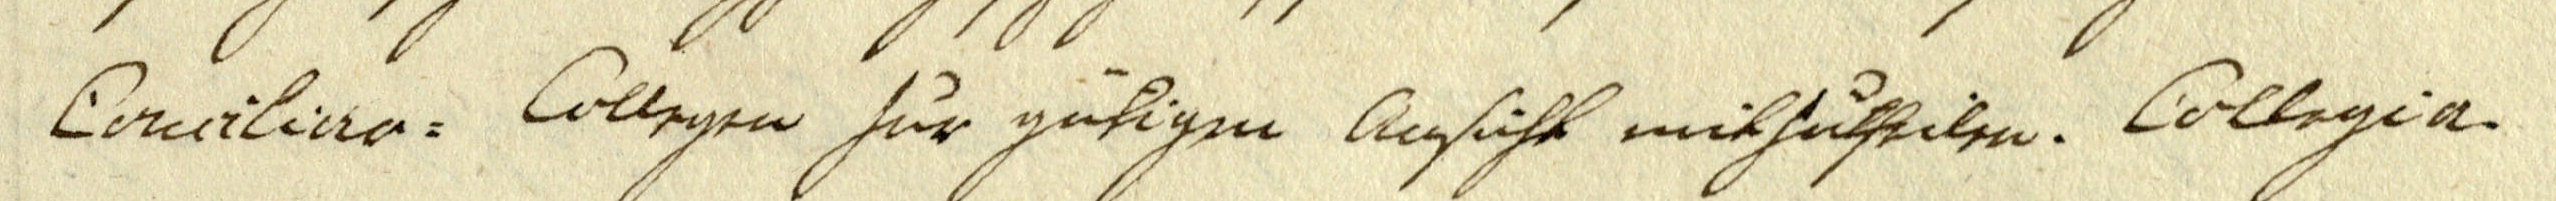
Conciliar-Collegen zur gütigen Ansicht mitzutheilen. Collegia¬
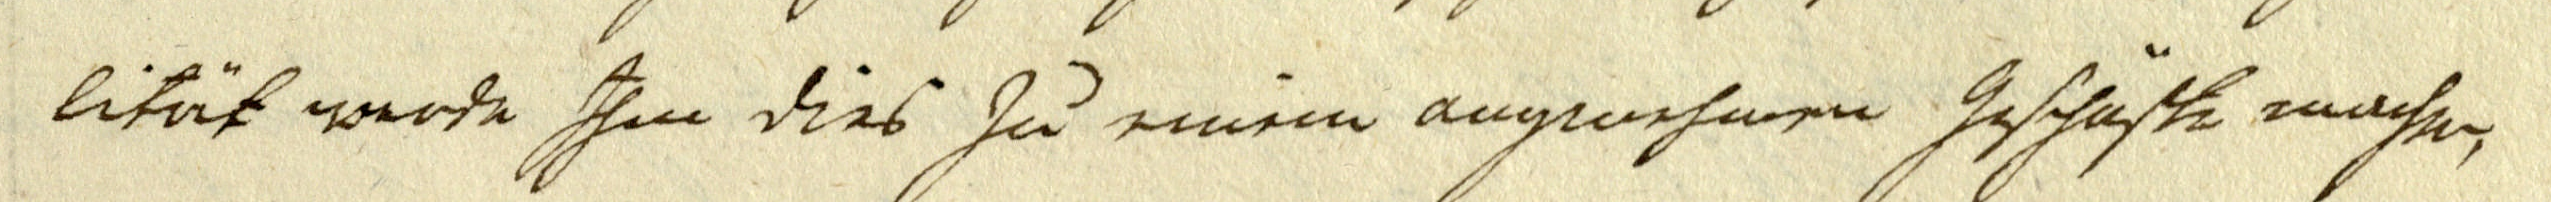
lität werde Ihm dies zu einem angenehmen Geschäfte machen,
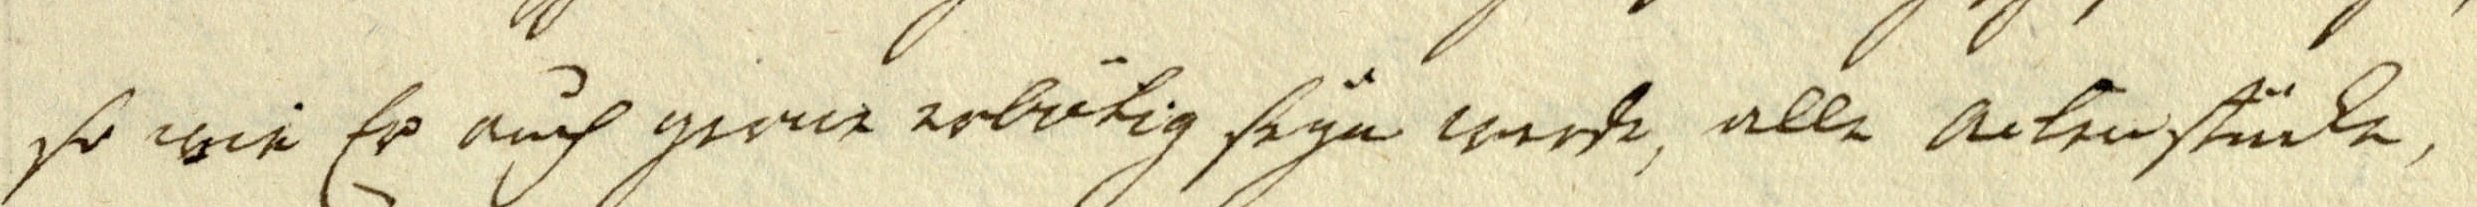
so wie Er auch gerne erbötig seÿn werde, alle Actenstücke,
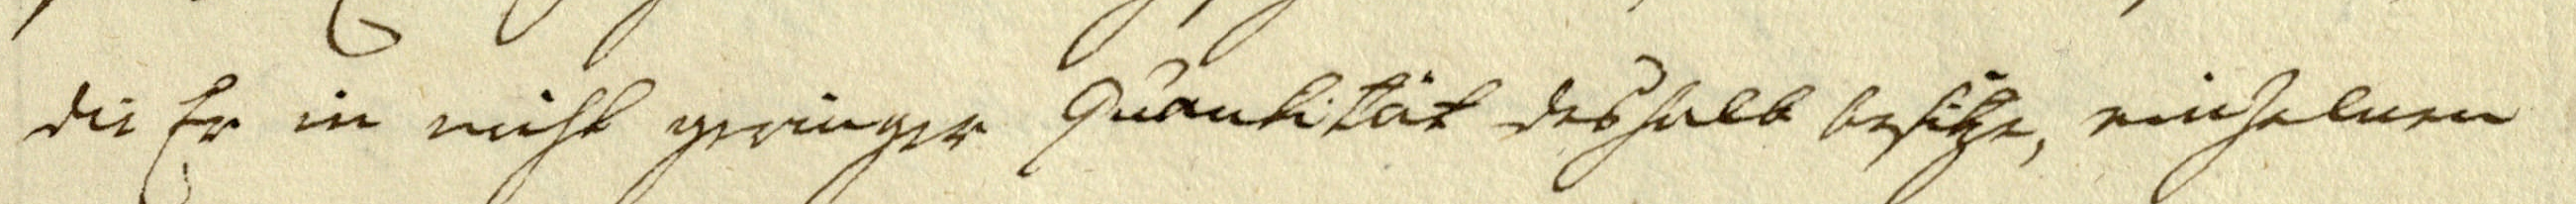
die er in nicht geringer Quantität deshalb besitze, einzelnen
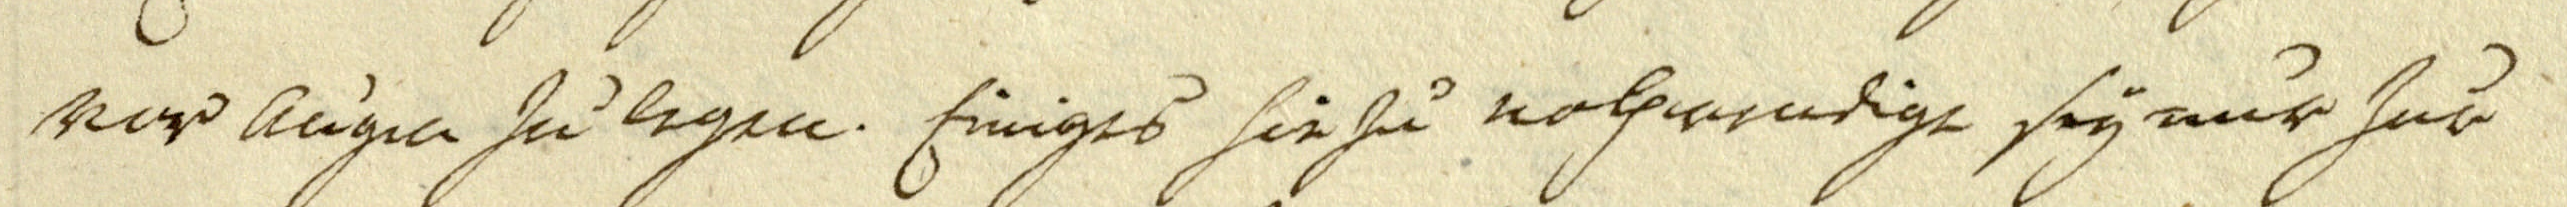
vor Augen zu legen. Einiges hiezu nothwendige seÿ nur zur
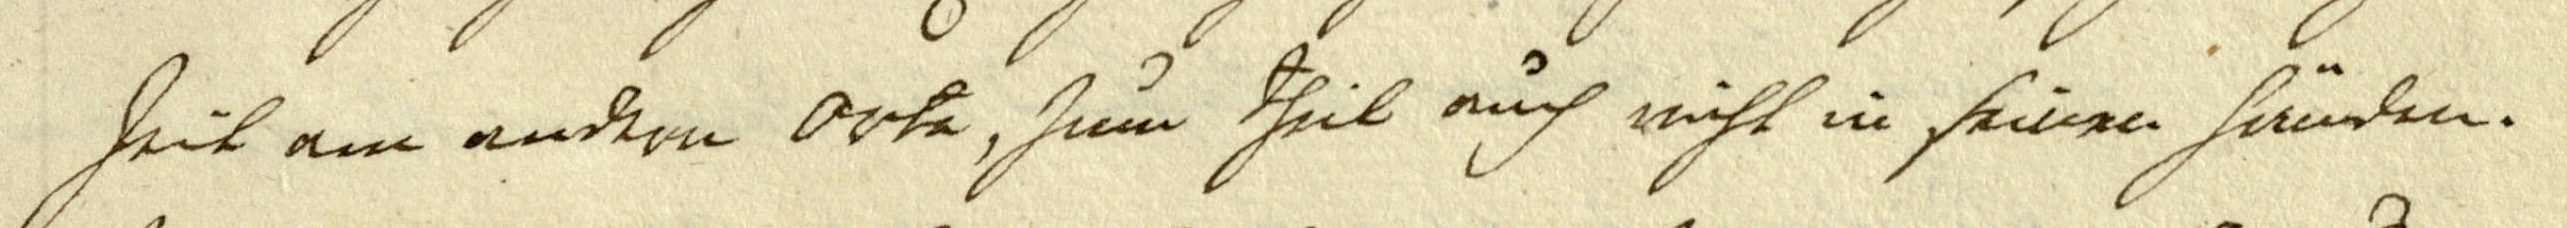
Zeit am andern Orte, zum Theil auch nicht in seinen händen.
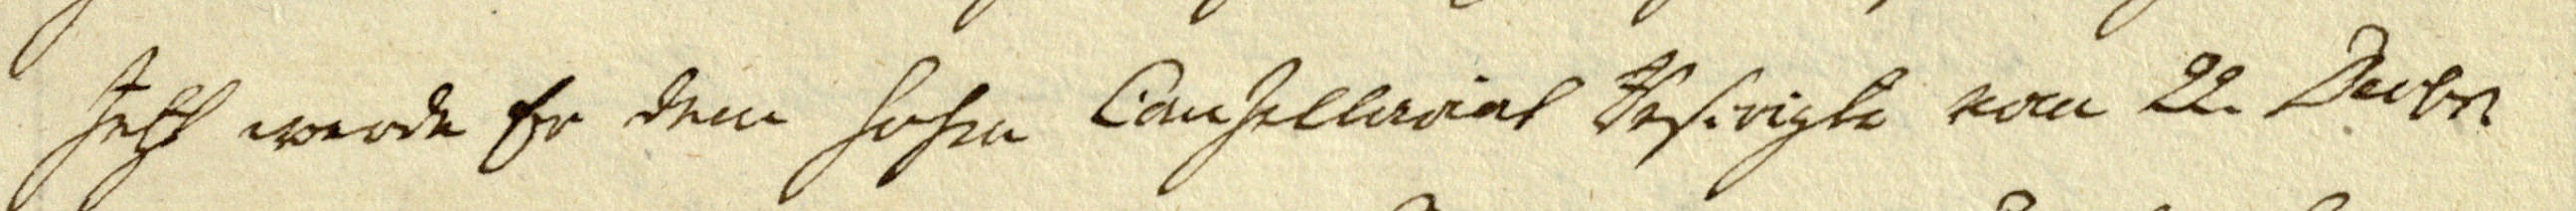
Jetzt werde Er dem hohen Canzellariat Rescripte vom 22. Decbr.
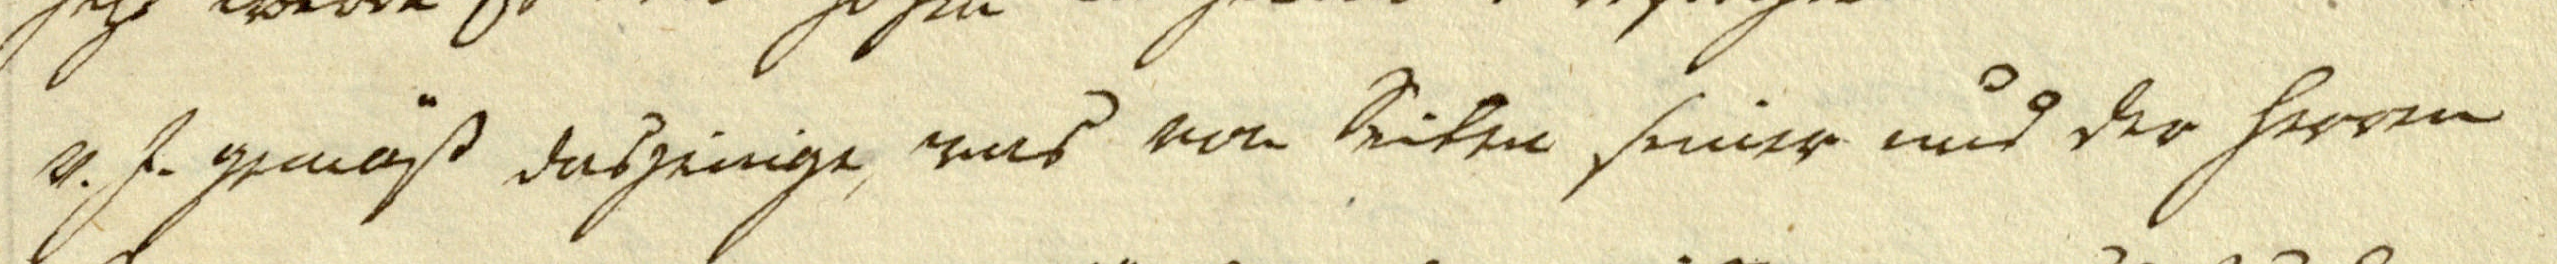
v. J. gemäß dasjenige, was von Seiten seiner und der herren
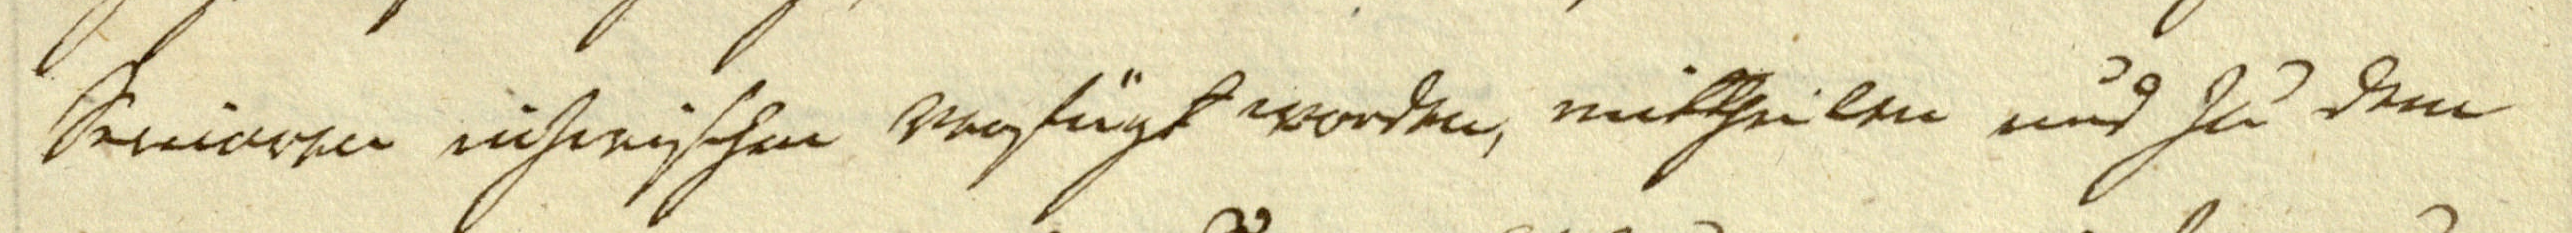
Senioren inzwischen verfügt worden, mittheilen und zu dem
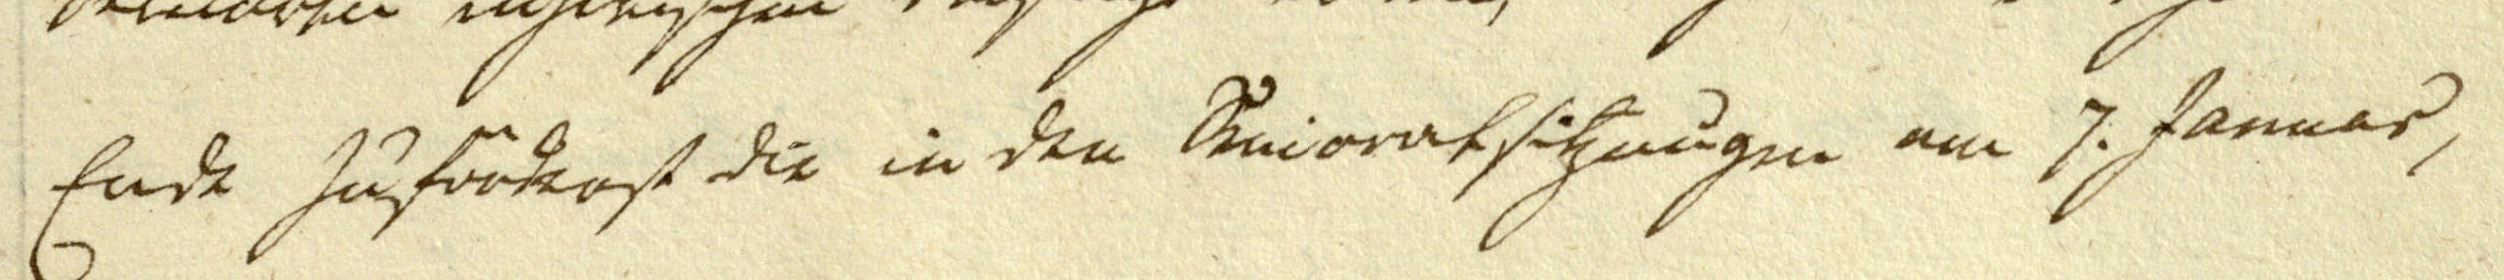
Ende zuförderst die in den Senioratsitzungen am 7. Januar,
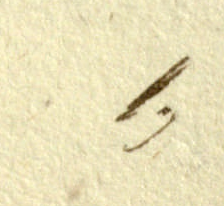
1.
